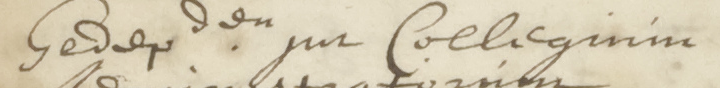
Gedepden. int Collegium
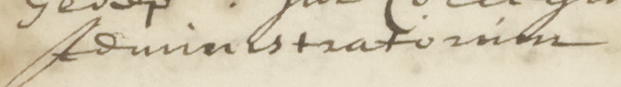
Administratorum
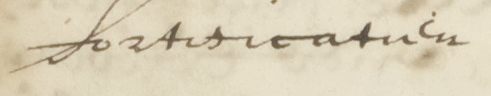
fortificatien
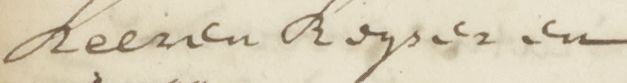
heeren keyser en
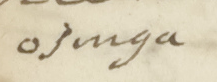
osinga
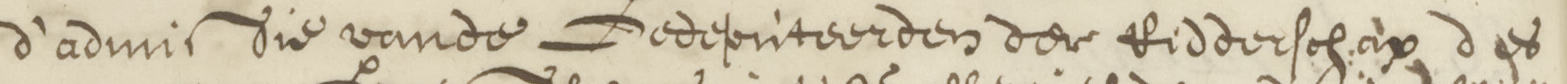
d'admissie vande Gedeputeerden der Ridderschap des
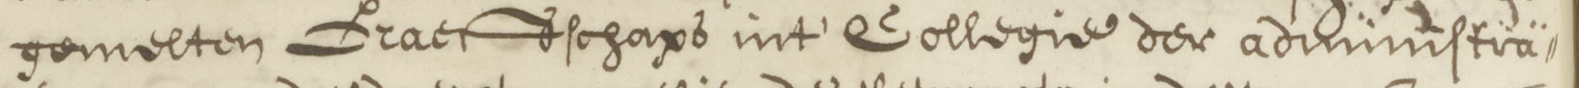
gemelten Graeffschaps int' Collegie der administra„
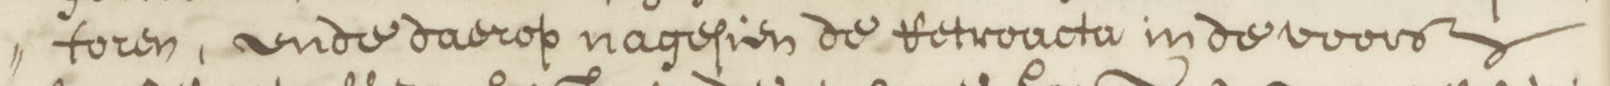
toren, ende daerop nagesien de Retroacta in de voorsz
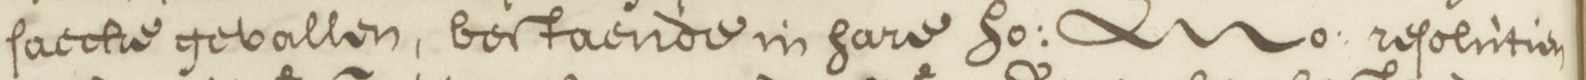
saecke gevallen, bestaende in hare ho:Mo: resolutien
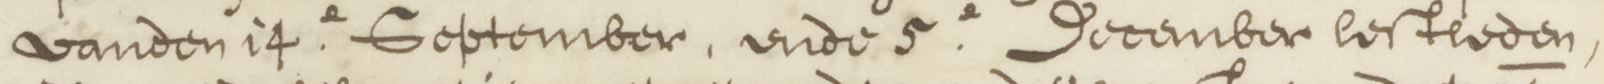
vanden 14e. September, ende 5e. December lestleden,
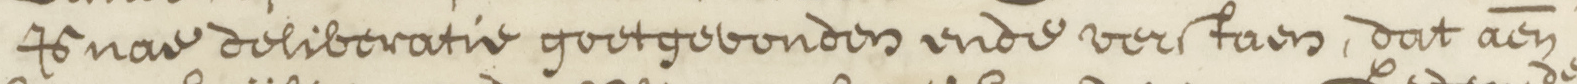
Is nae deliberatie goetgevonden ende verstaen, dat aen
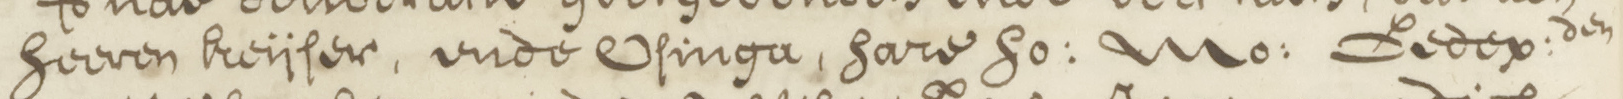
heeren keijser, ende Osinga, hare ho:Mo: Gedep:den
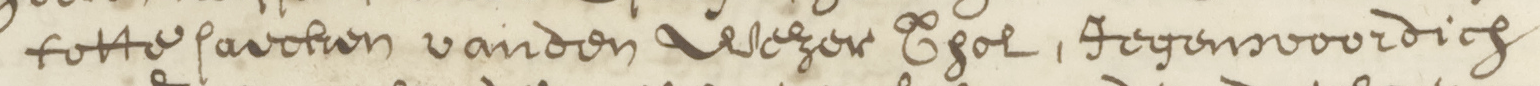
totte saecken vanden Wezer Thol, Jegenwoordich
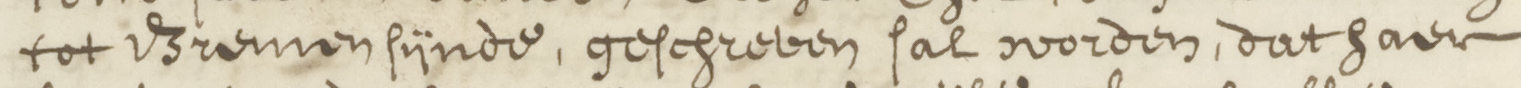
tot Bremen sijnde, geschreven sal worden, dat haer
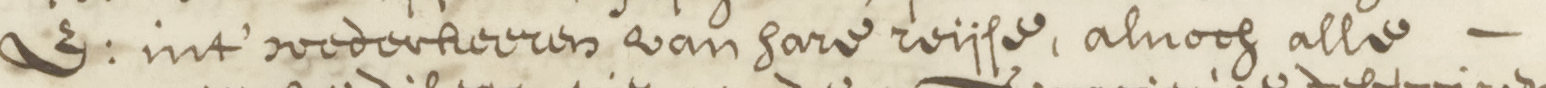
E: int' wederkeeren van hare reijse, alnoch alle -
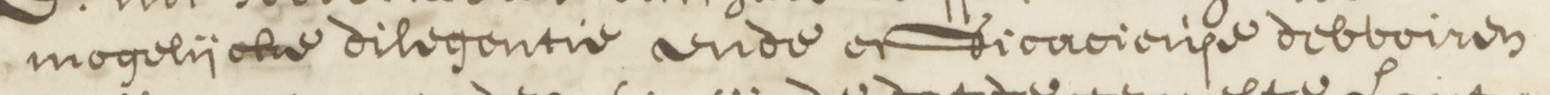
mogelijcke dilegentie ende efficacieuse debvoiren
